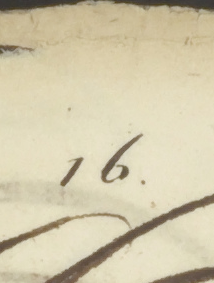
16.
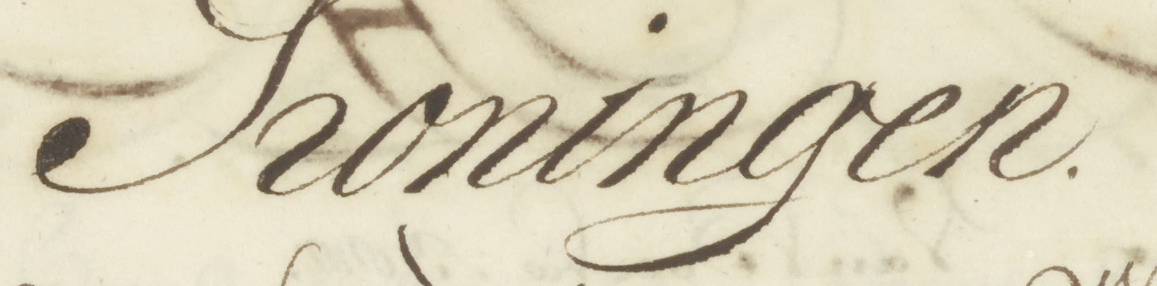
Groningen.
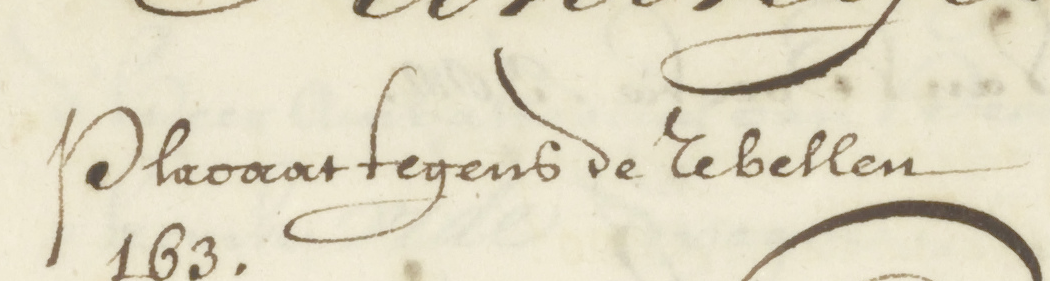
Placaat tegens de rebellen
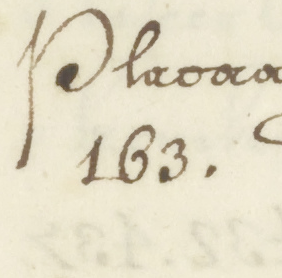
163.
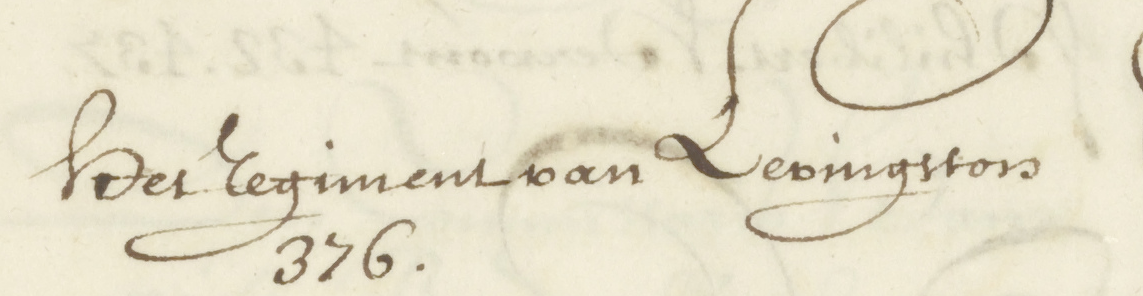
het regiment van Levingston
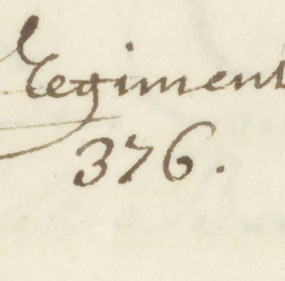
376.
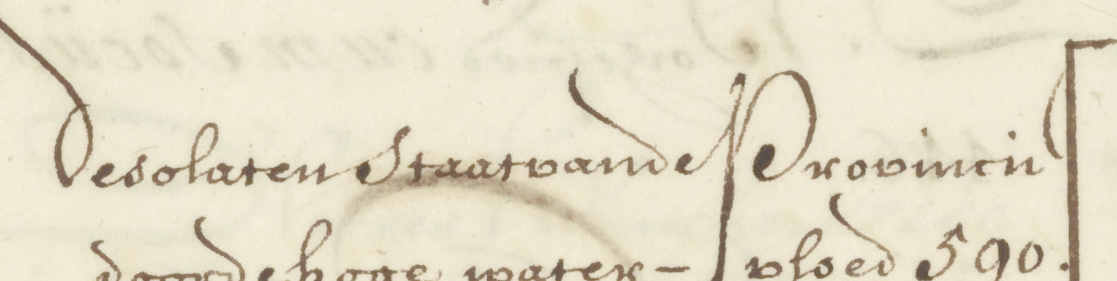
desolaten Staat vande Provincie
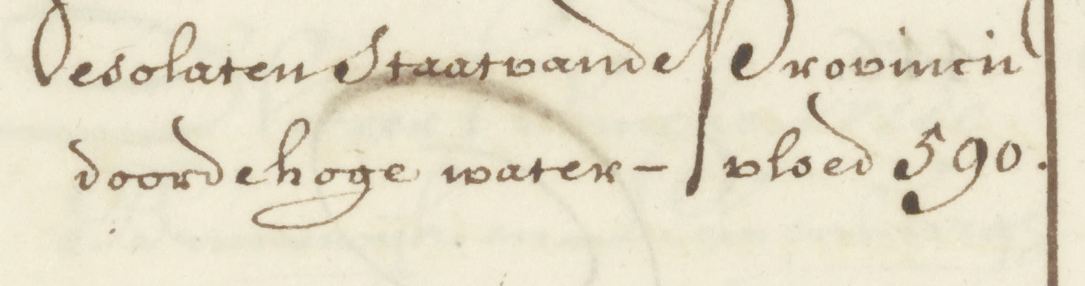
door de hoge water- vloed 590.
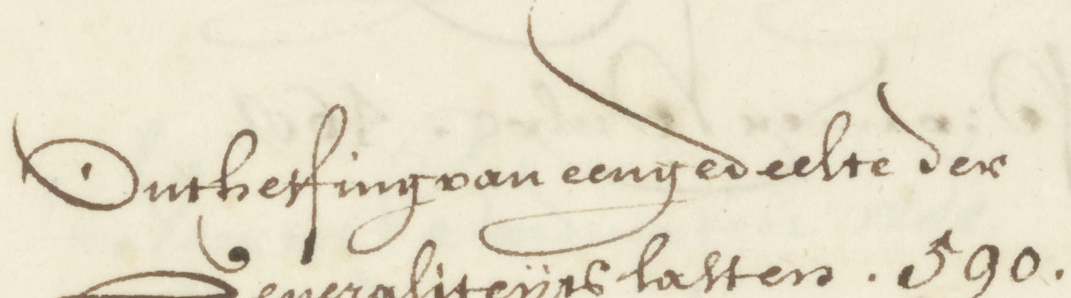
Ontheffing van een gedeelte der
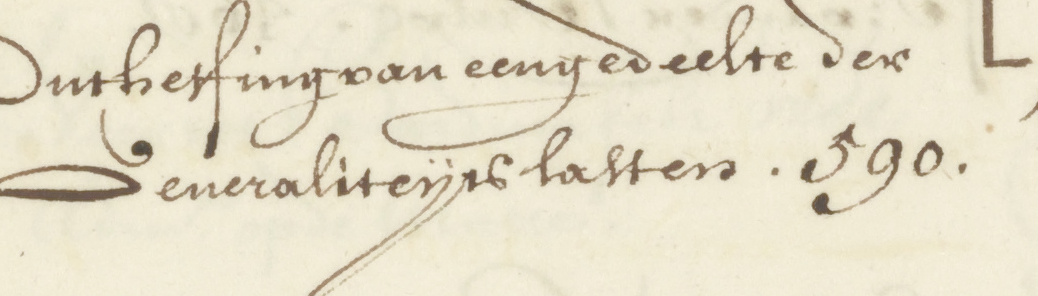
Generaliteijts lasten, 590.
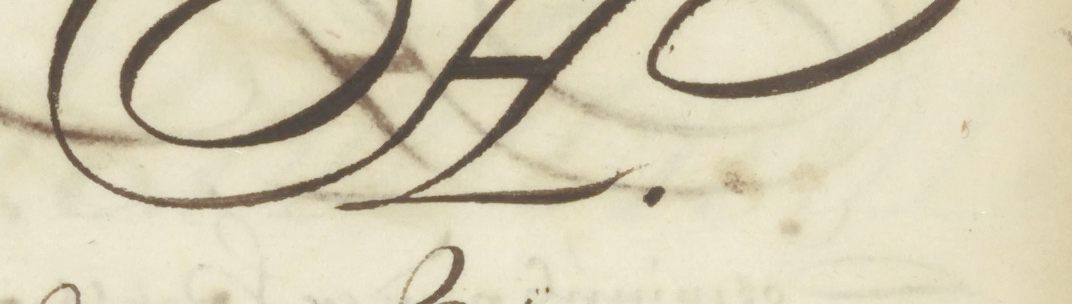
H.
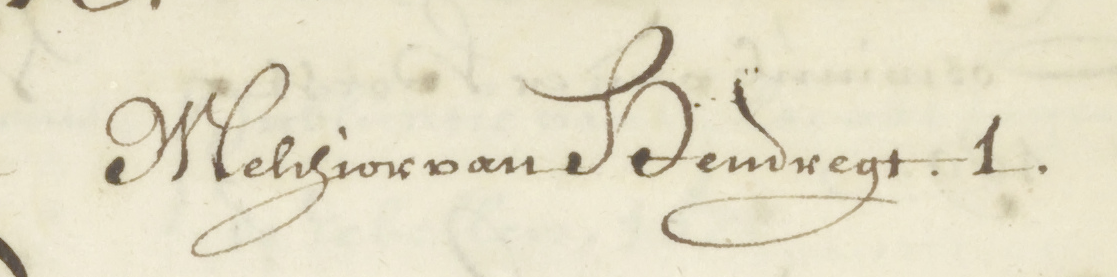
Melchior van Hendregt, 1.
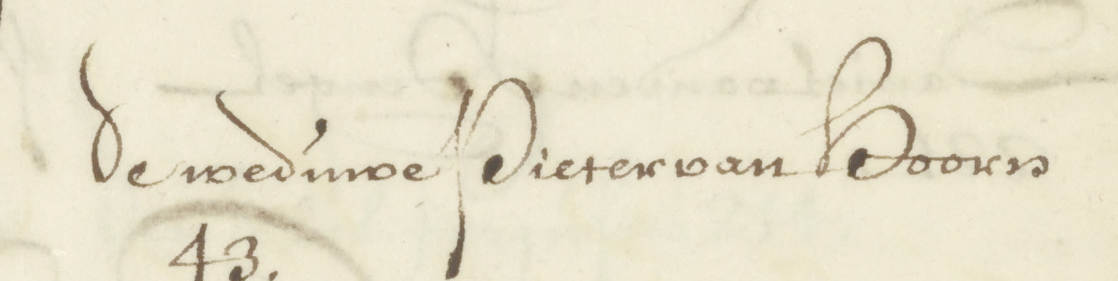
de weduwe Pieter van Hoorn
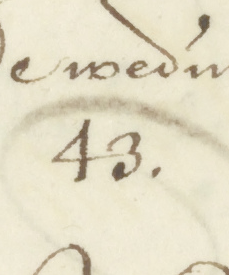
43.
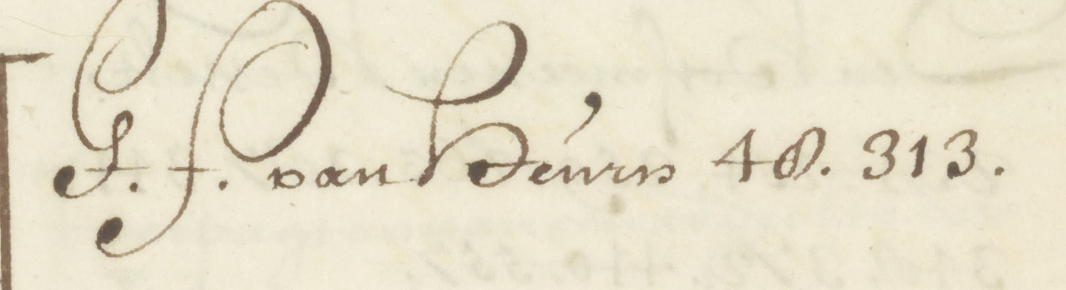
G.F. van Heurn 48, 313.
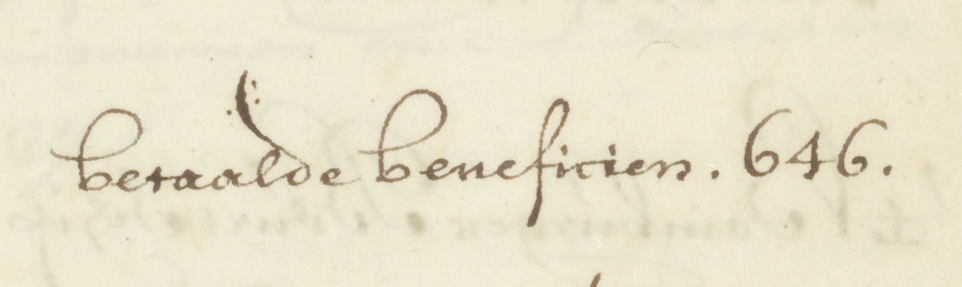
betaalde beneficien, 646.
